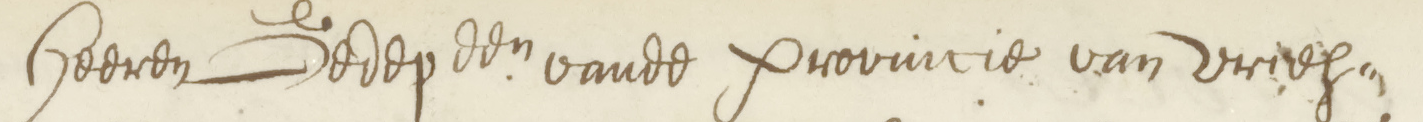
heeren Gedepden vande Provincie van Vries,,
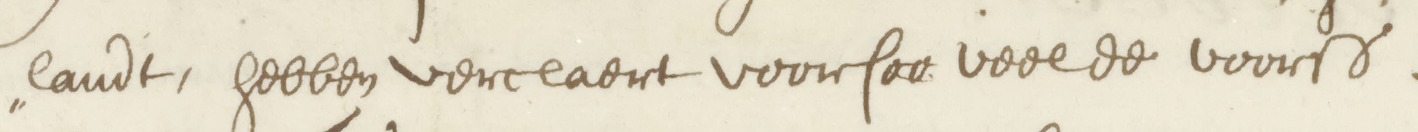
landt, hebben verclaert voorsoo veel de voors
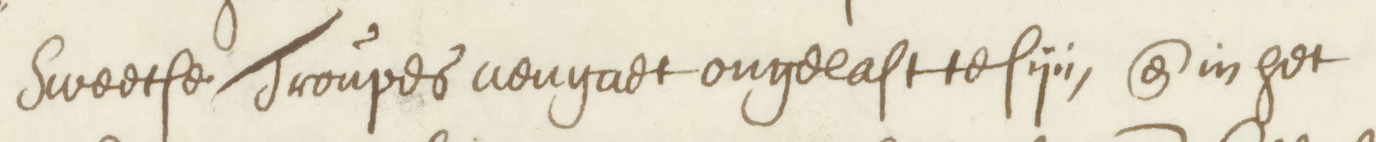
Sweetse Troupes aengaet ongelast te sijn, & in het
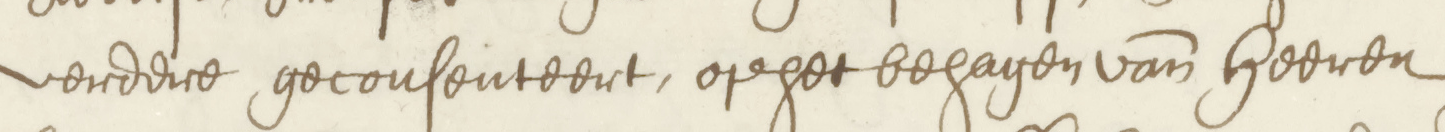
verdere geconsenteert, op het behagen van heeren
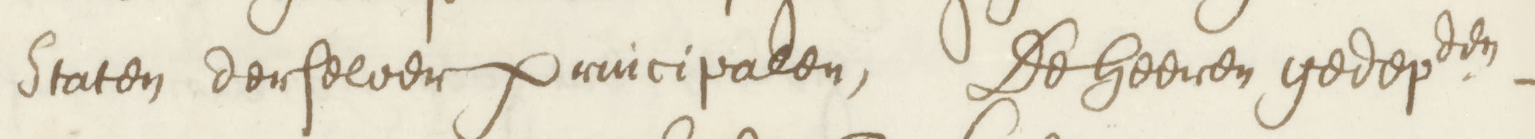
Staten derselver Principalen. De heeren gedepden
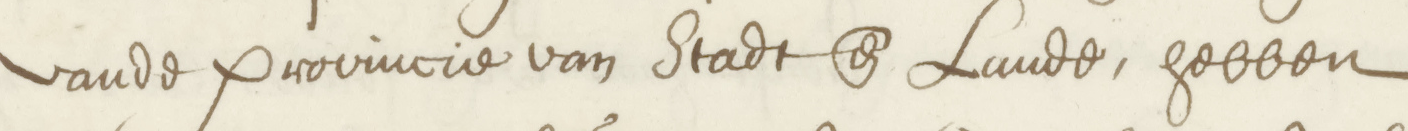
vande provincie van Stadt & Lande, hebben
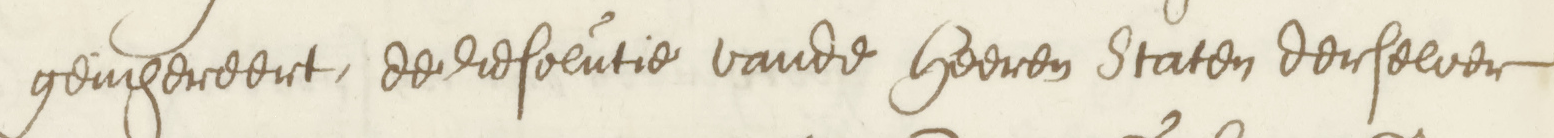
geinhereert, de resolutie vande heeren Staten derselver
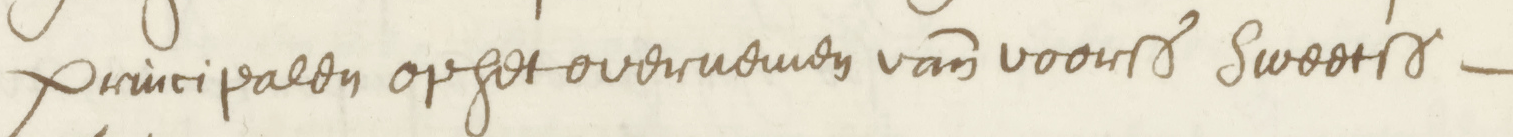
Principalen op het overnemen van voors Sweets -
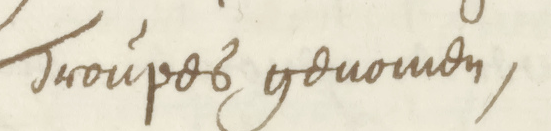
Troupes genomen.
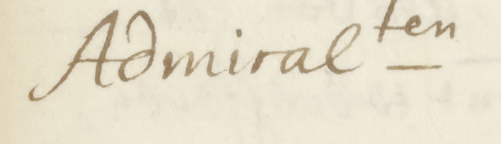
Admiralten
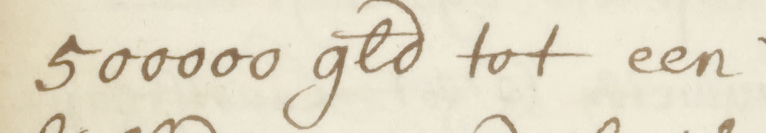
500000 gld tot een
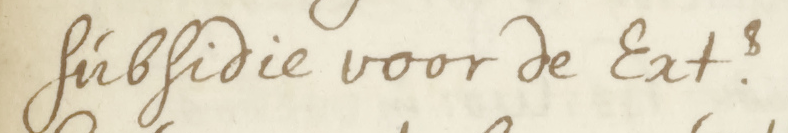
subsidie voor de Exts.
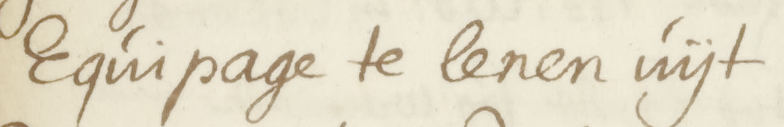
Equipage te lenen uijt
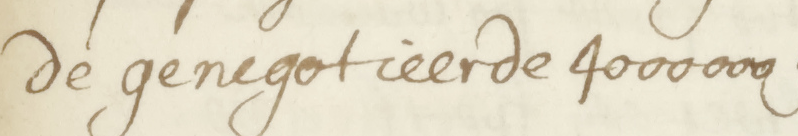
de genegotieerde 4000000
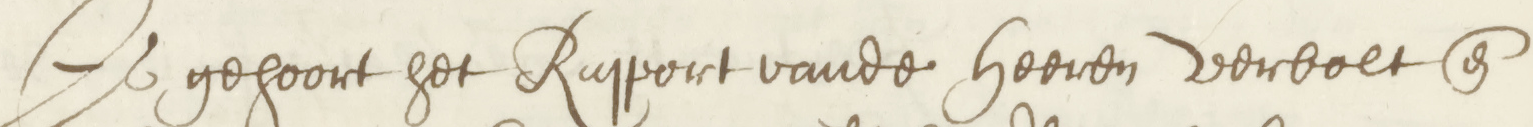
Is gehoort het Rapport vande Heeren Verbolt &
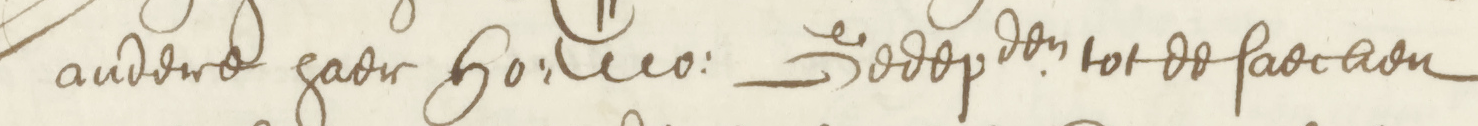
andere haer Ho:Mo: Gedepden tot de saecken
